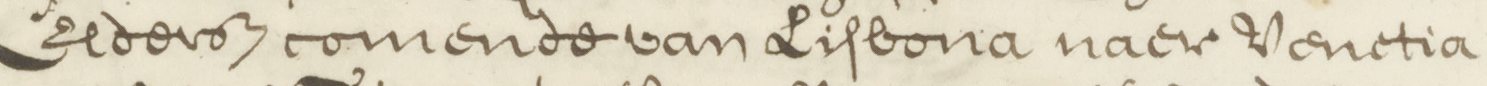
Eldersz comende van Lisbona naer Venetia
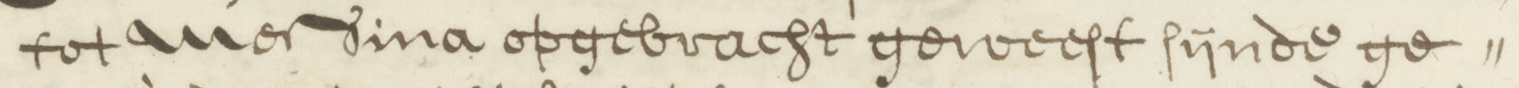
tot Messina opgebracht geweest sijnde ge„
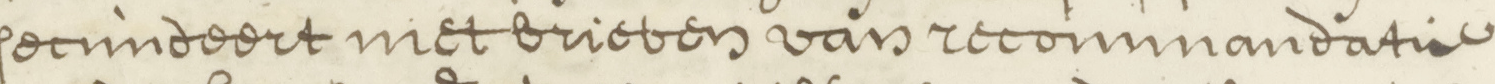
secundeert met brieven van recommandatie
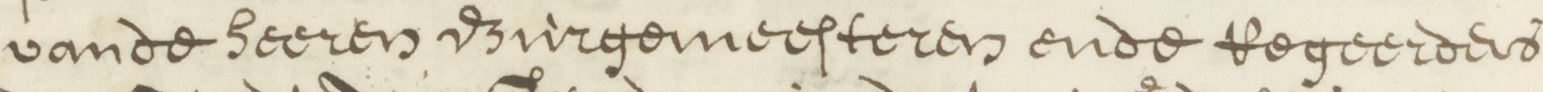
van de heeren Burgemeesteren ende Regeerders
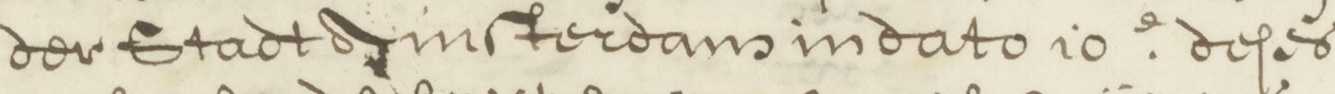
der Stadt Amsterdam in dato 10e. deses,
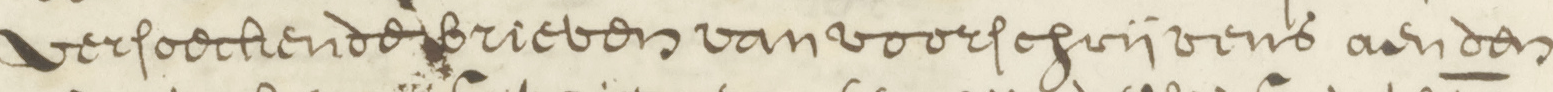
versoeckende brieven van voorschrijvens aen den
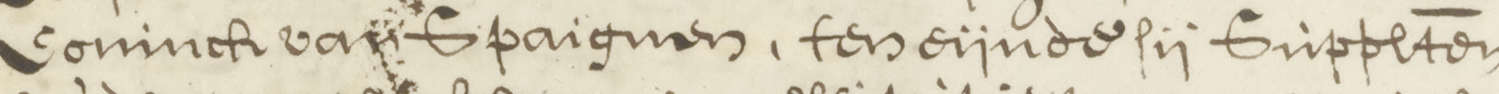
Coninck van Spaignen, ten eijnde sij Supplten
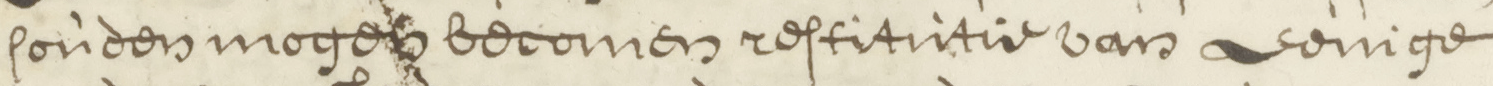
souden mogen becomen restitutie van eenige
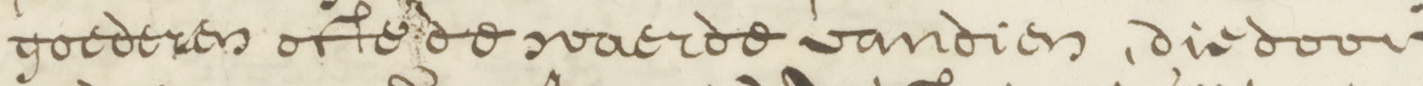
goederen ofte de waerde vandien, die door
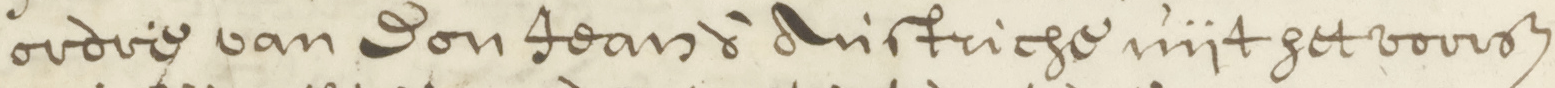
ordre van Don Jean d‛ Austriche uijt het voors
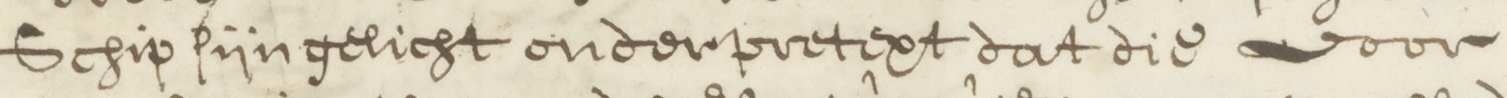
Schip sijn gelicht onder pretext dat die voor
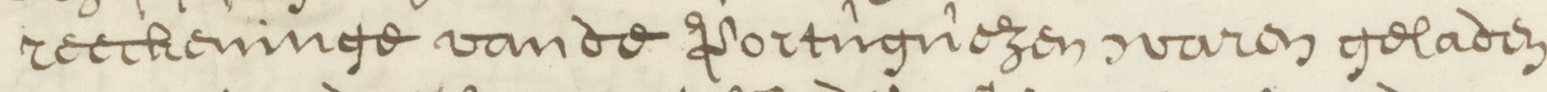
reeckeninge van de Portuguezen waren geladen.
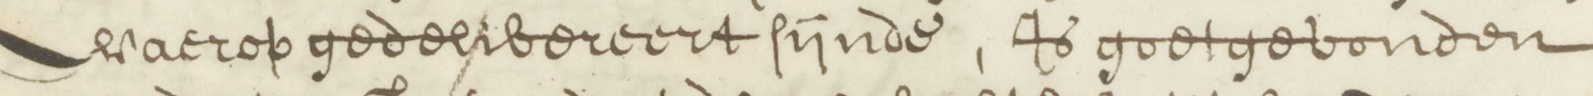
Waerop gedelibereert sijnde, Is goetgevonden
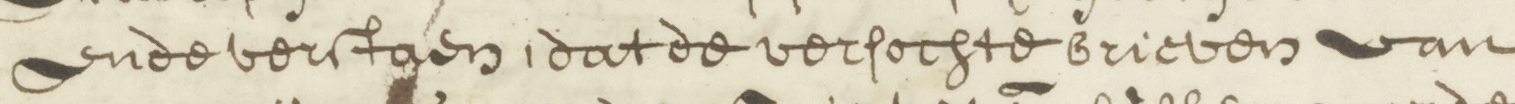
ende verstaen, dat de versochte brieven van
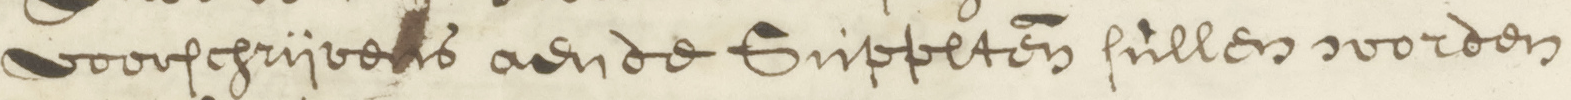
voorschrijvens aende Supplten sullen worden
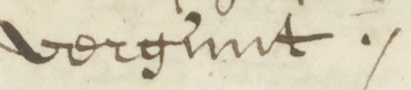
vergunt.
